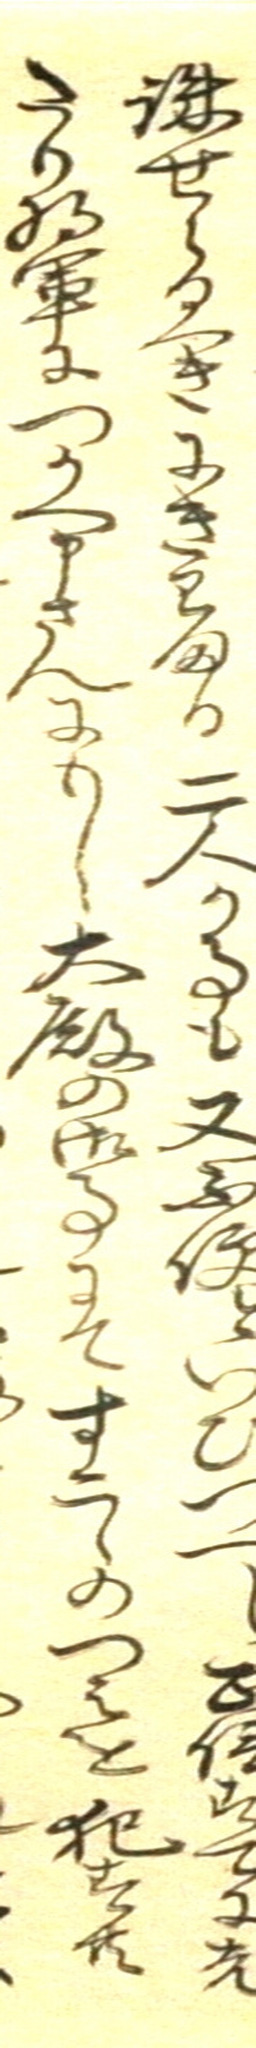たり将軍につかへ申さんにもし大殿の御事にてすこしのつみを犯す共
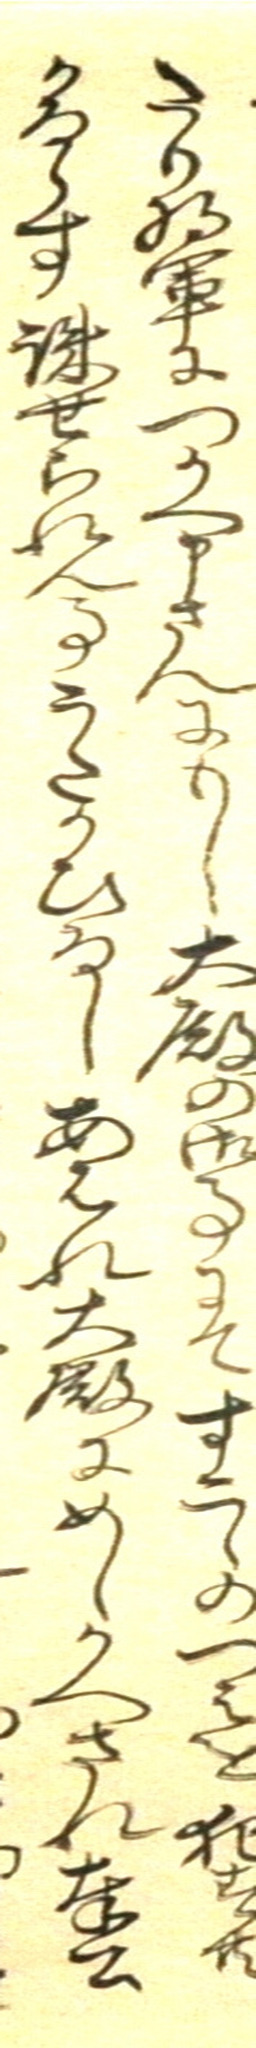かならす誅せられん事うたかひなしあはれ大殿にめしかへされ奉公
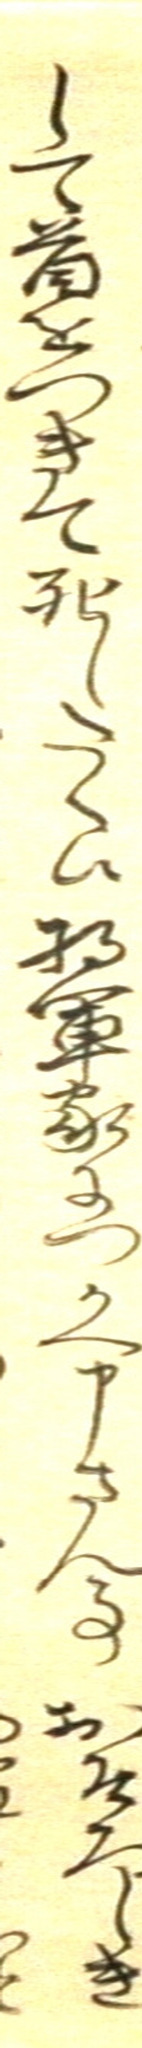して首をつきて死したく候将軍家につかへ申さん事おそろしき
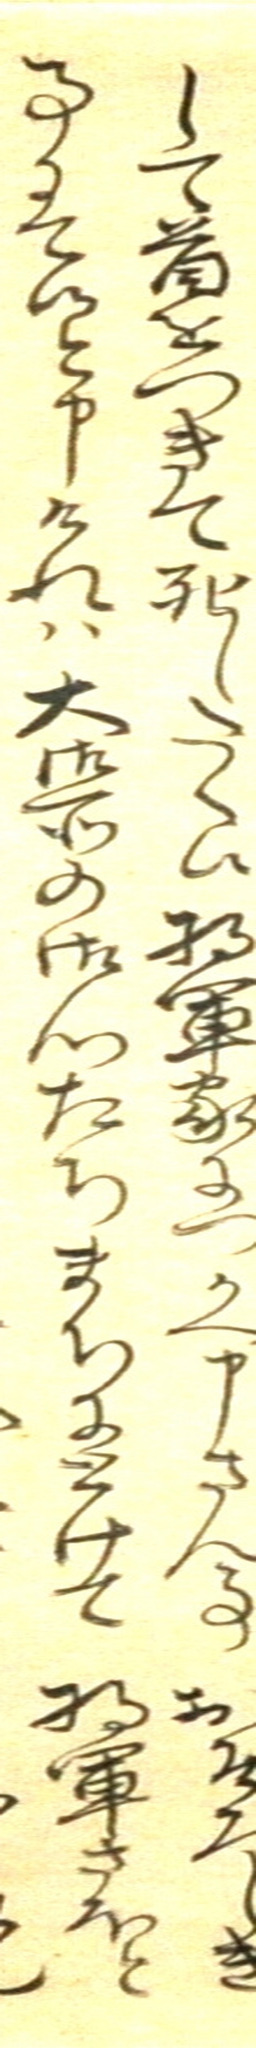事にて候と申けれは大御所の御心たちまちにとけて将軍さほと
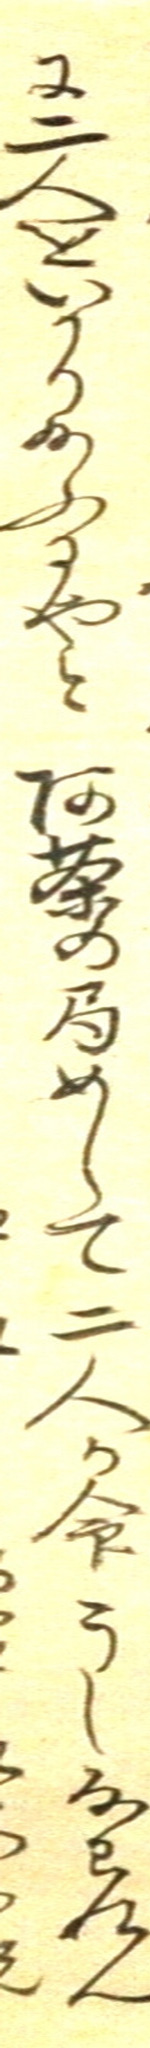に二人をいかり給ふにやと阿茶の局めして二人か命うしなわれん
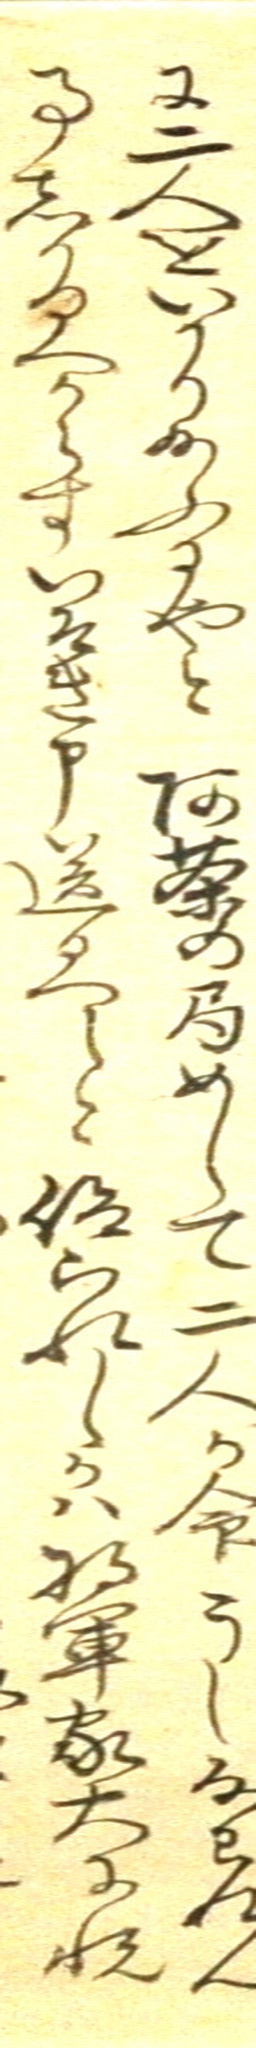事しかるへからすいそき申送るへしと仰られしかは将軍家大に悦
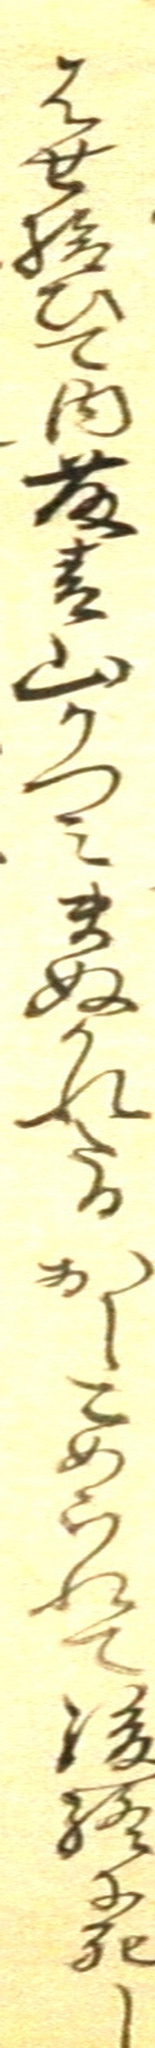はせ給ひて内藤青山かつみまぬかれたるおしこめられて後終に死し
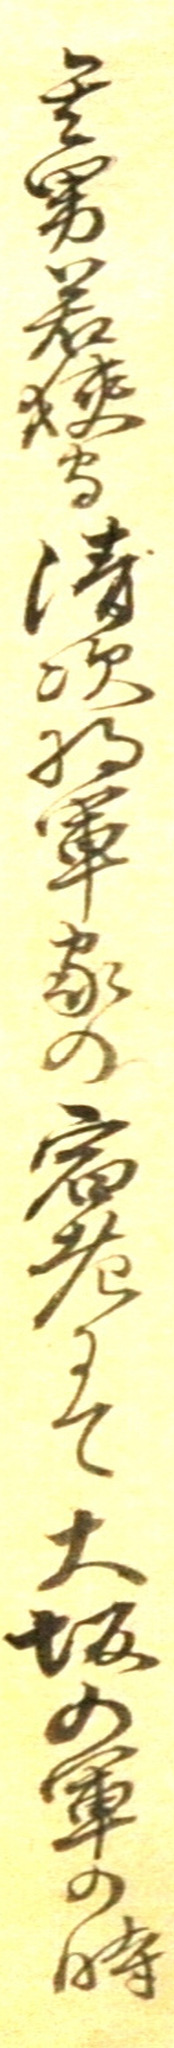其男若狭守清次将軍家の宿老にて大坂の軍の時

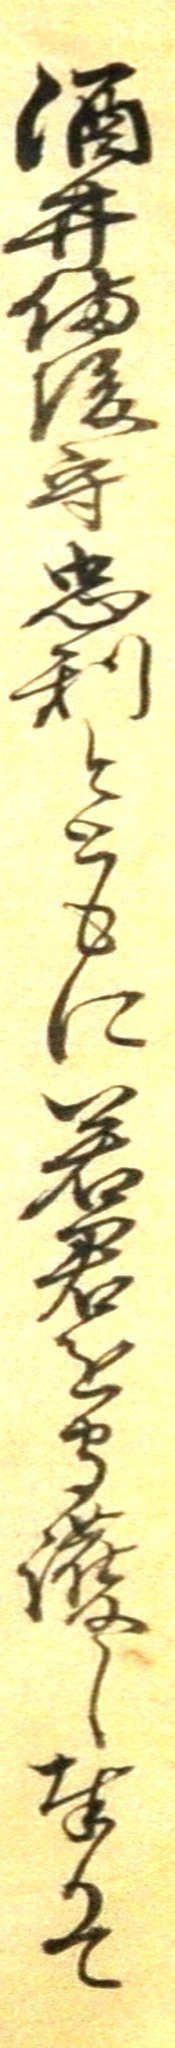酒井備後守忠利とともに若君を守護し奉りて
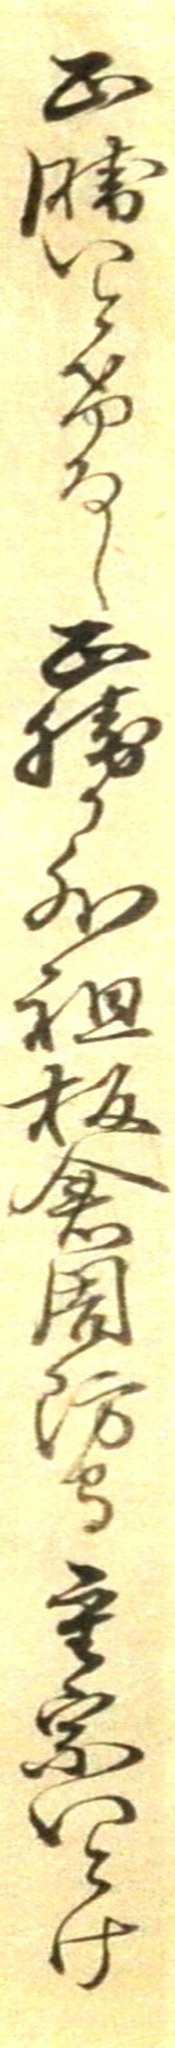正勝いとけなし正勝か外祖板倉周防守重宗いとけ
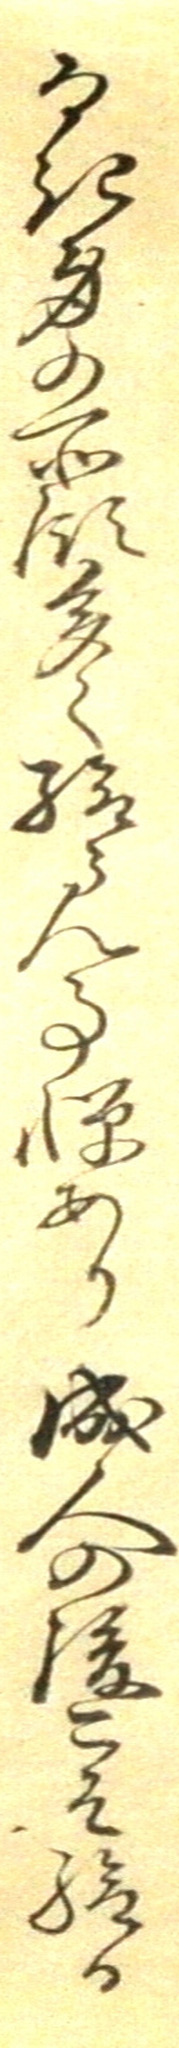なき身の所領多く給らん事憚あり成人の後こそ給る
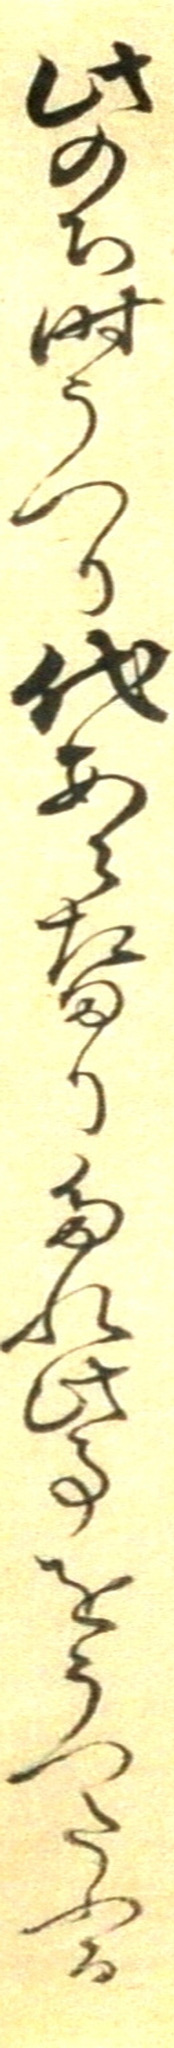此のち時うつり代あらたまりたれ此事をうつたふる
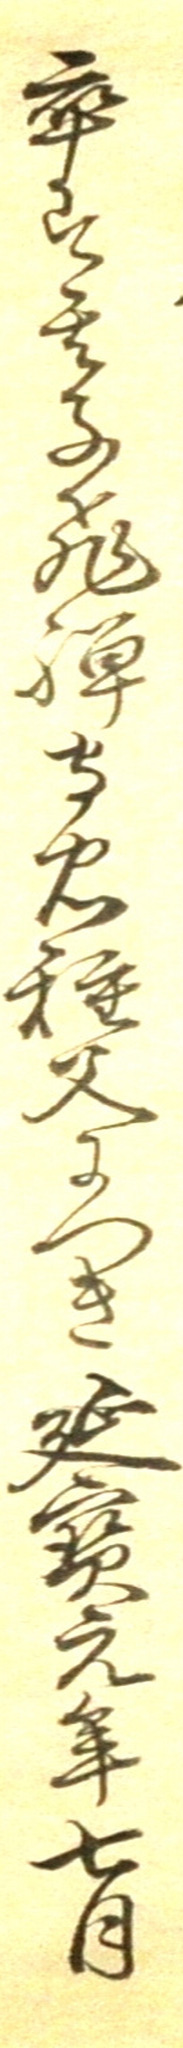卒す其子飛騨守忠種父につき延宝元年七月
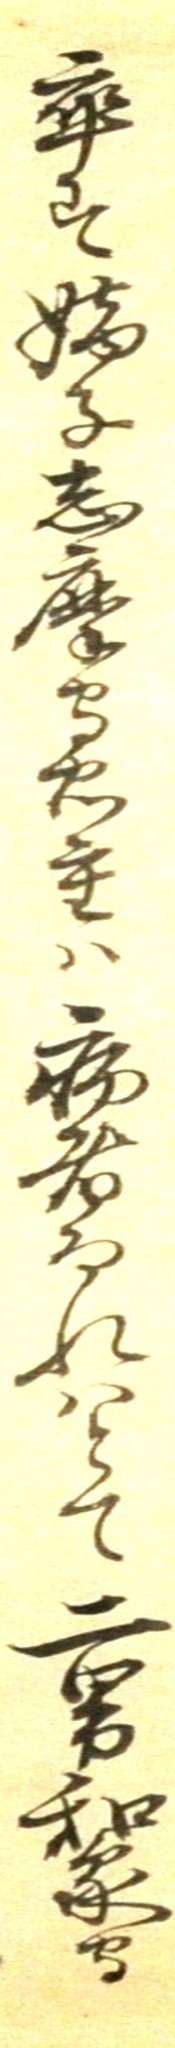卒す嫡子志摩守忠重は病者なれはとて二男和泉守

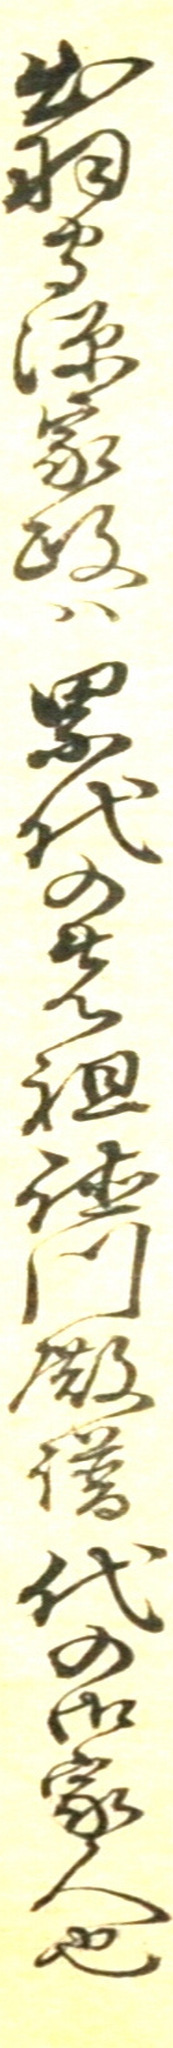出羽守源家政は累代の先祖徳川殿譜代の御家人也
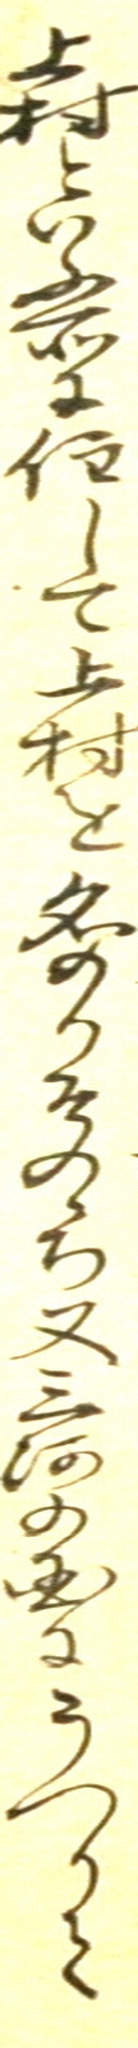上村といふ所に住して上村を名のりそのゝち又三河の国にうつりて
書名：藩翰譜（四・中）
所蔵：伊那市立高遠町図書館・合同会社AMANE
